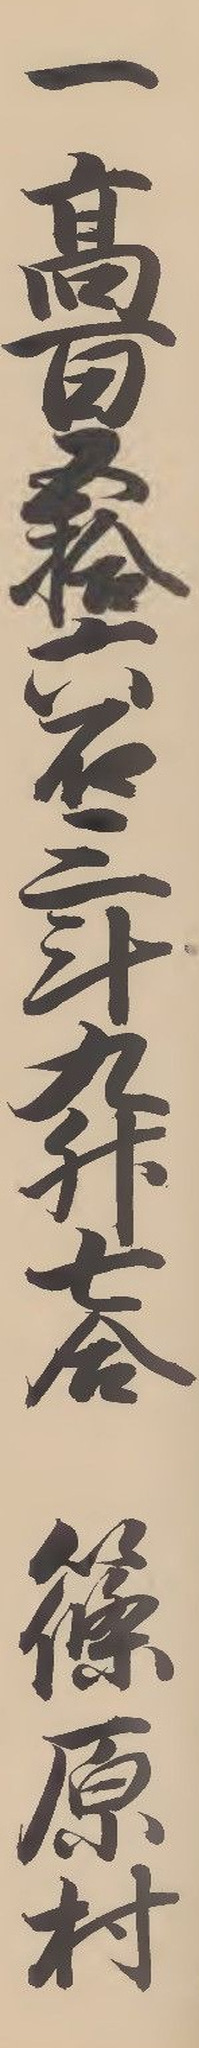一高百五拾六石三斗九升七合篠原村
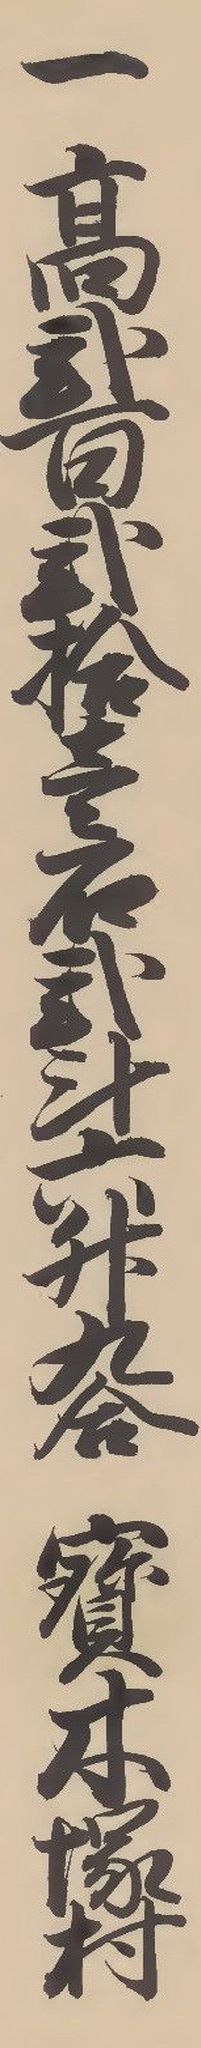一高弐百弐拾壱石弐斗六升九合宝木塚村
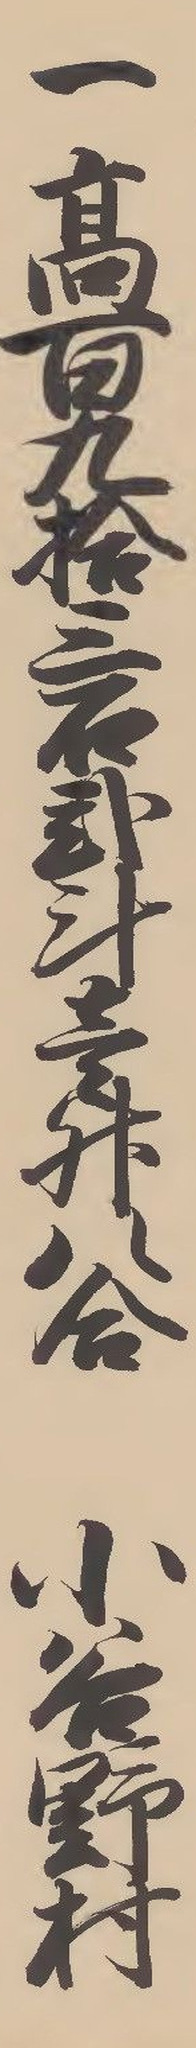一高百九拾三石弐斗壱升八合小谷野村
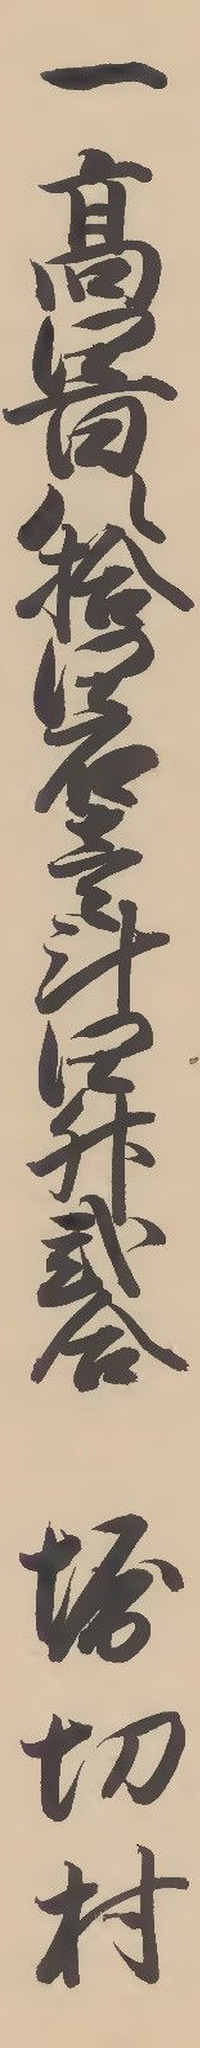一高四百八拾四石壱斗四升弐合堀切村

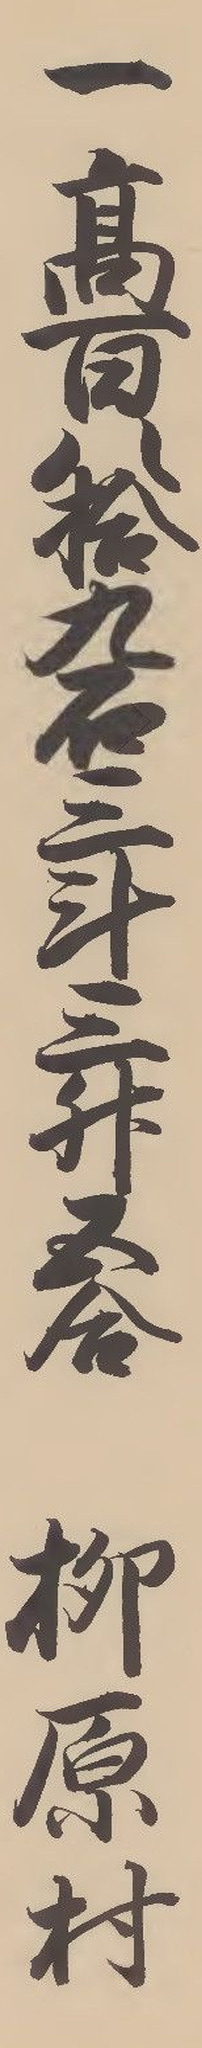一高百八拾九石三斗三升五合柳原村
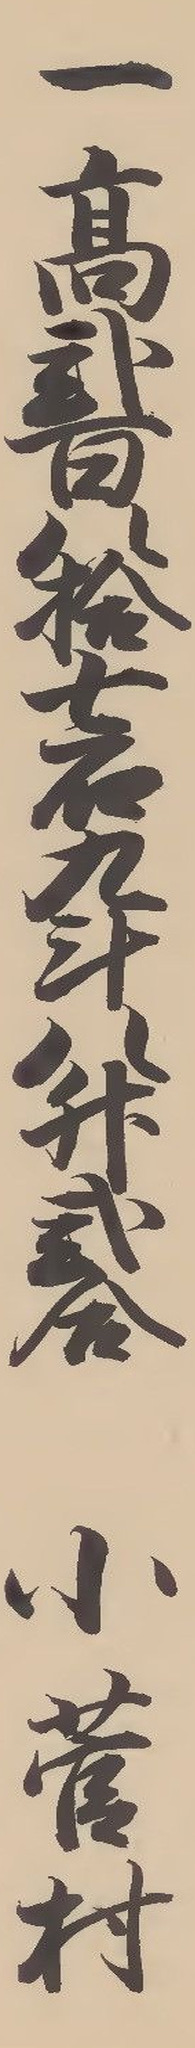一高弐百八拾七石九斗八升弐合小菅村
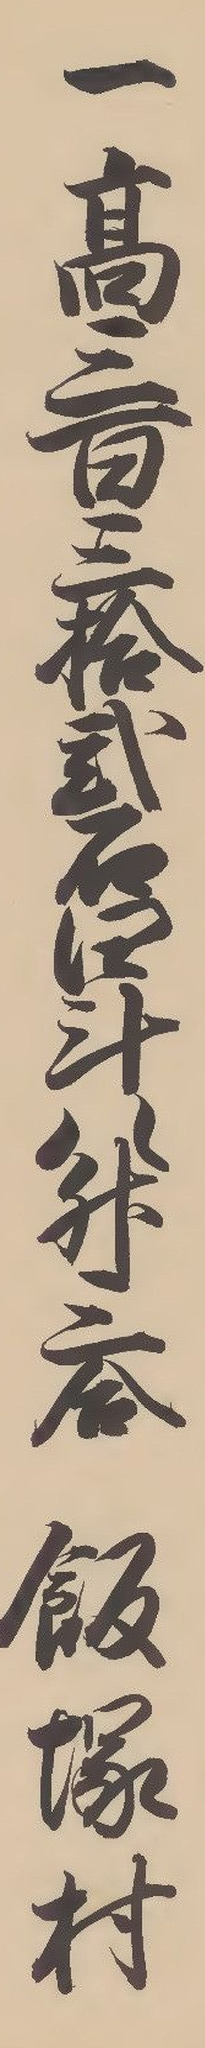一高三百三拾弐石四斗八升三合飯塚村
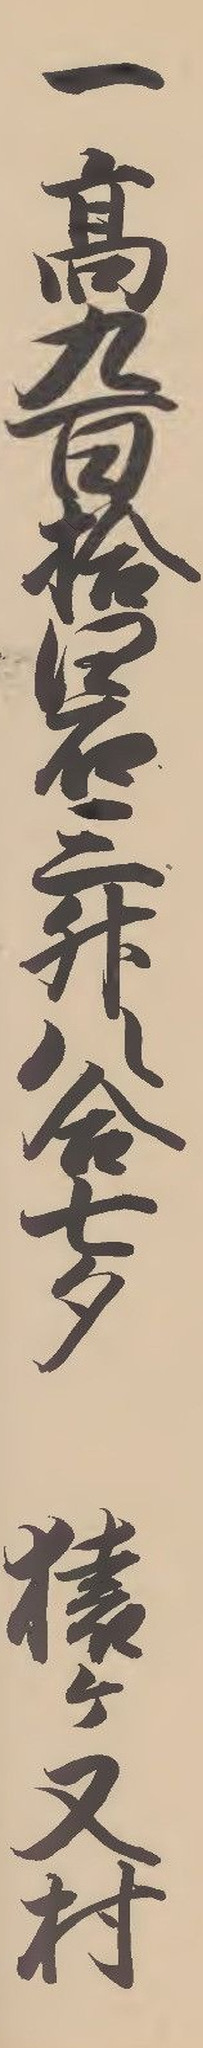一高九百拾四石三升八合七勺猿ヶ又村
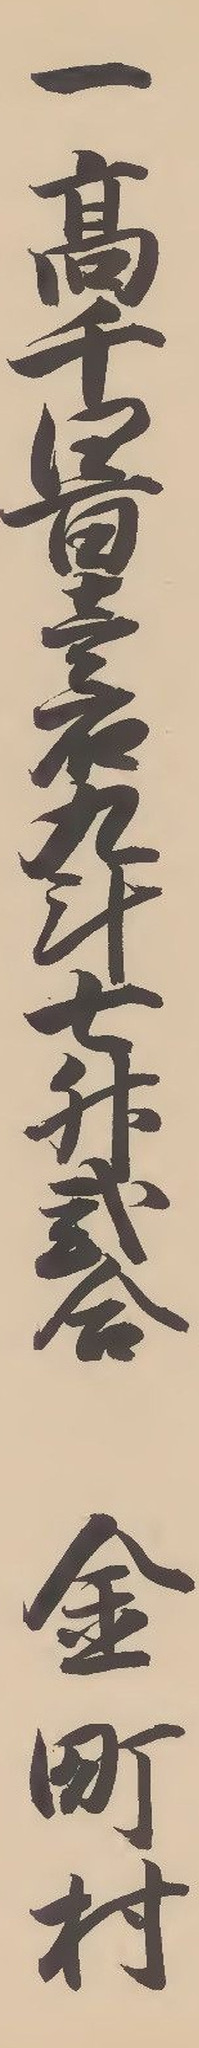一高千四百壱石九斗七升弐合金町村
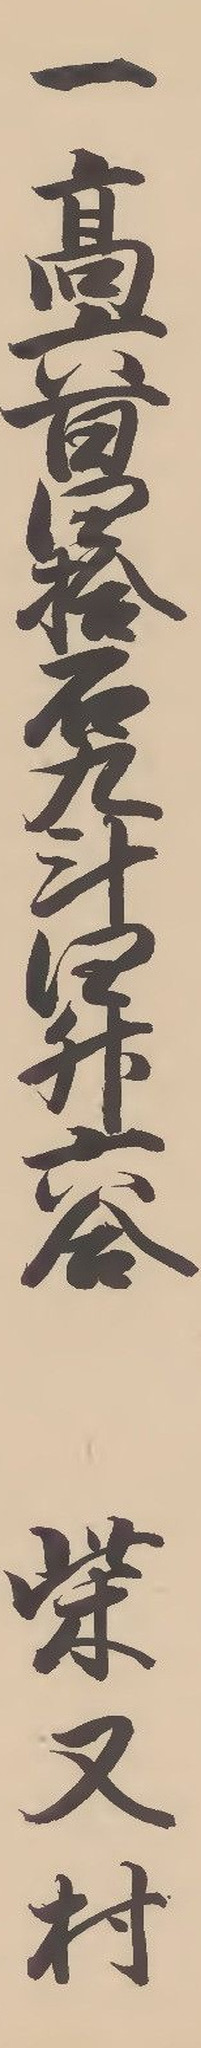一高六百四拾石九斗四升六合柴又村
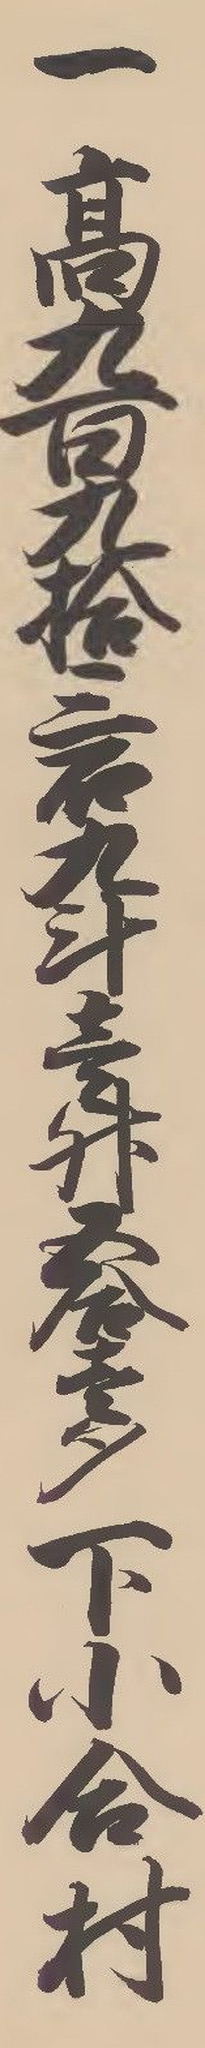一高九百九拾三石九斗壱升五合壱勺下小合村

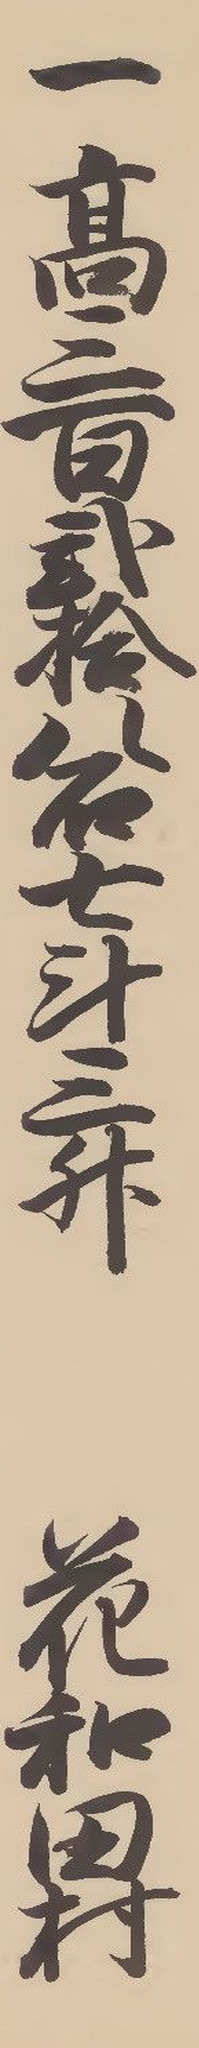一高三百弐拾八石七斗三升花和田村
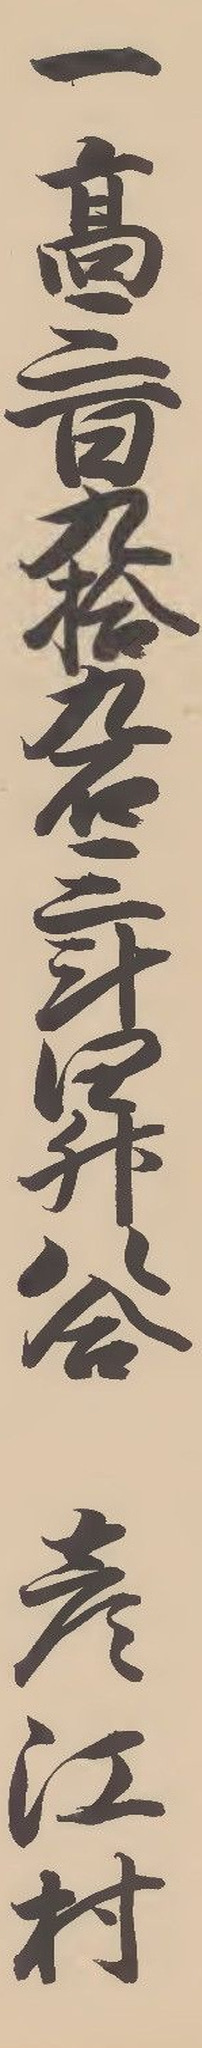一高三百九拾九石三斗四升八合彦江村
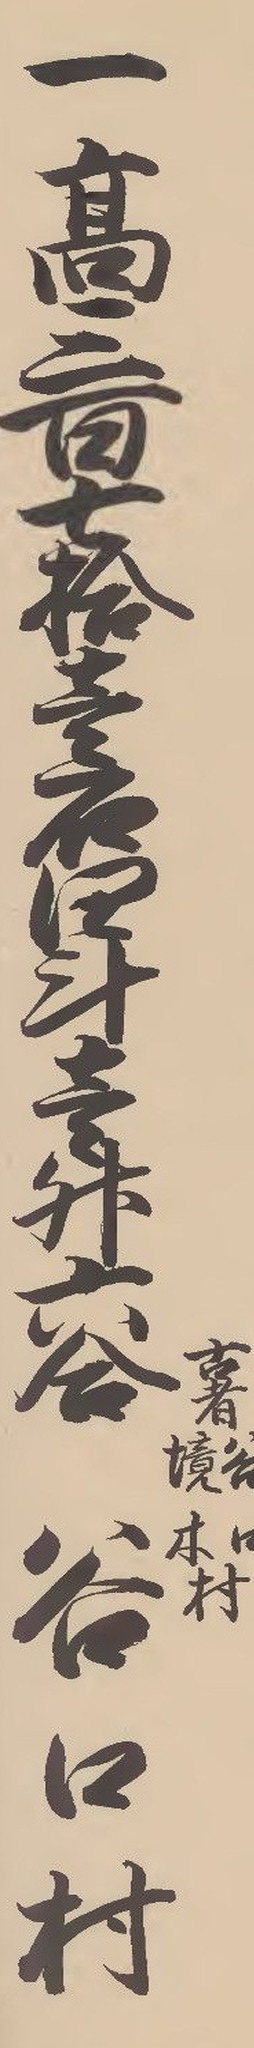一高三百七拾壱石四斗壱升六合谷口村
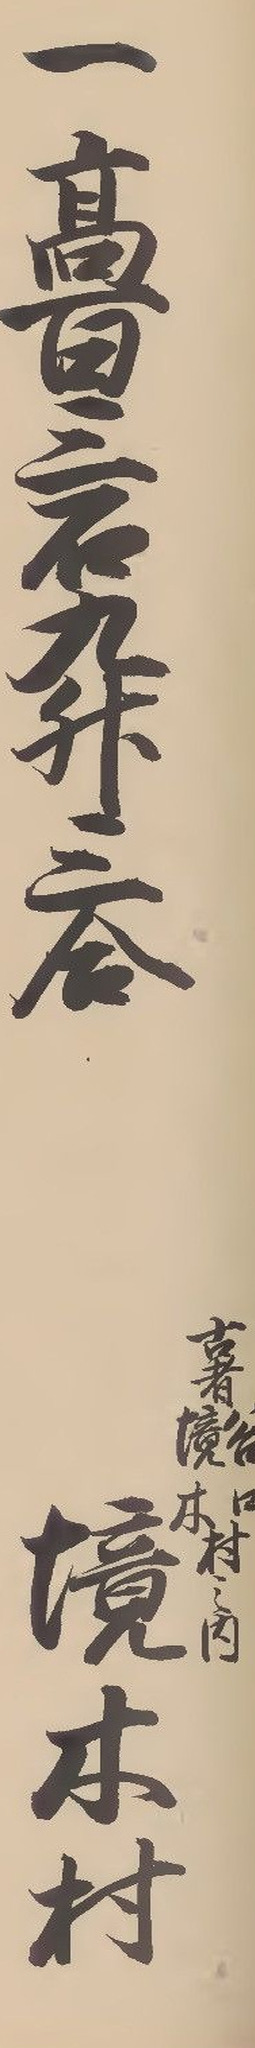一高百三石九升三合境木村
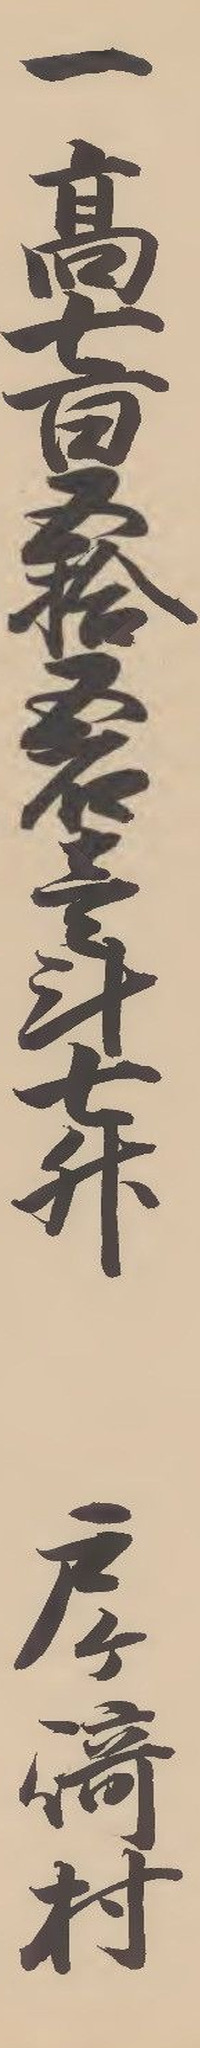一高七百五拾五石壱斗七升戸ヶ崎村
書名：武蔵国郷帳　下
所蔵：国立公文書館 National Archives of Japan
